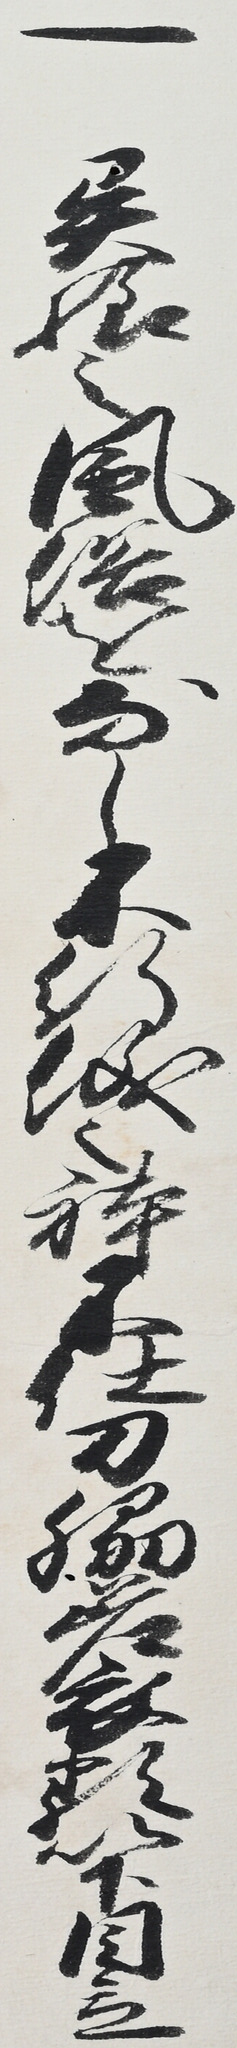一異様之風俗をなし不行儀之躰不仕刀脇差衣類以下目立
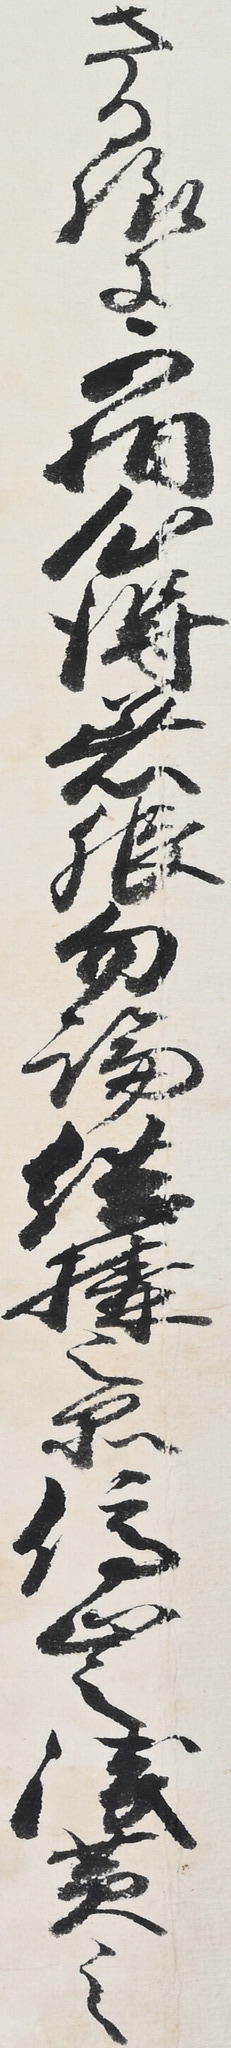さる様に可相心得着服勿論結構之品停止之浅黄之
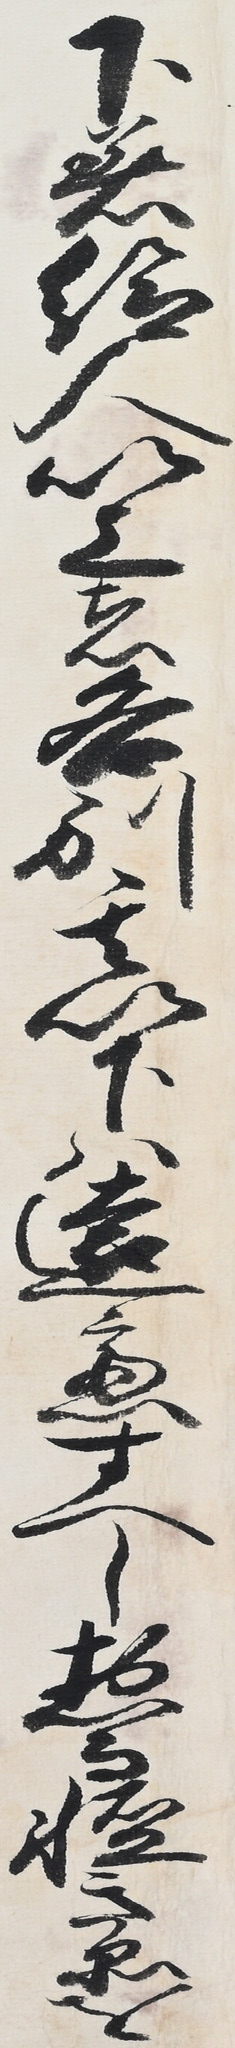下着給人以上者各別其以下ハ遠慮すへし惣而軽き品を
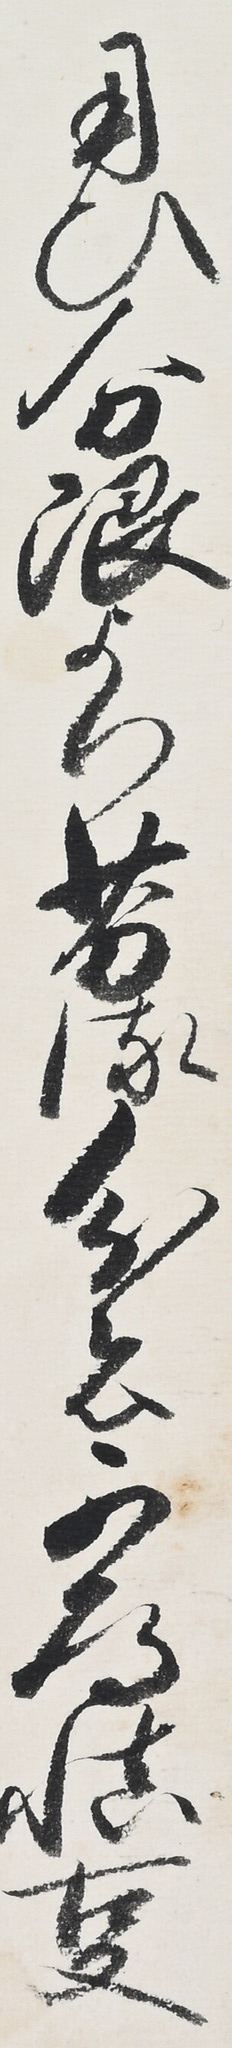用ひ分限より芬る分者可為慎事
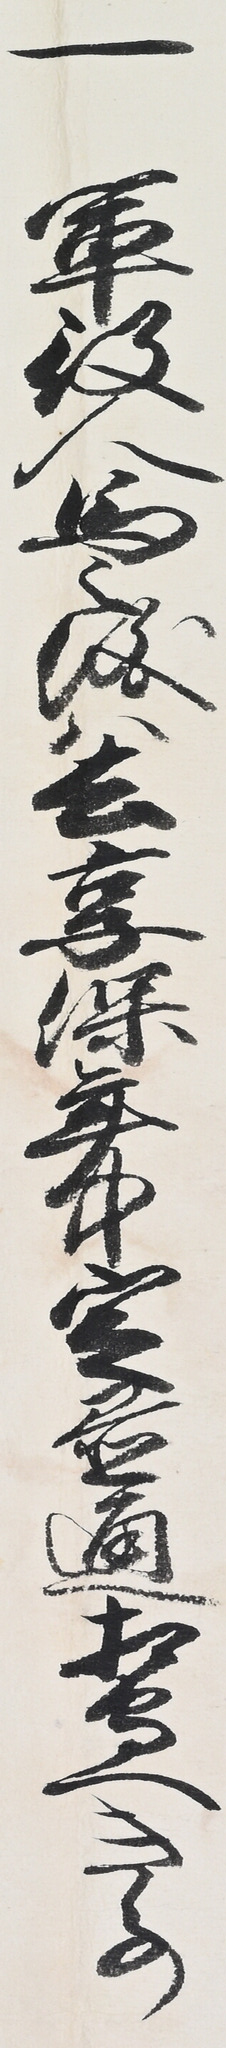一軍役人馬之儀ハ去享保年中定置通相守へき事
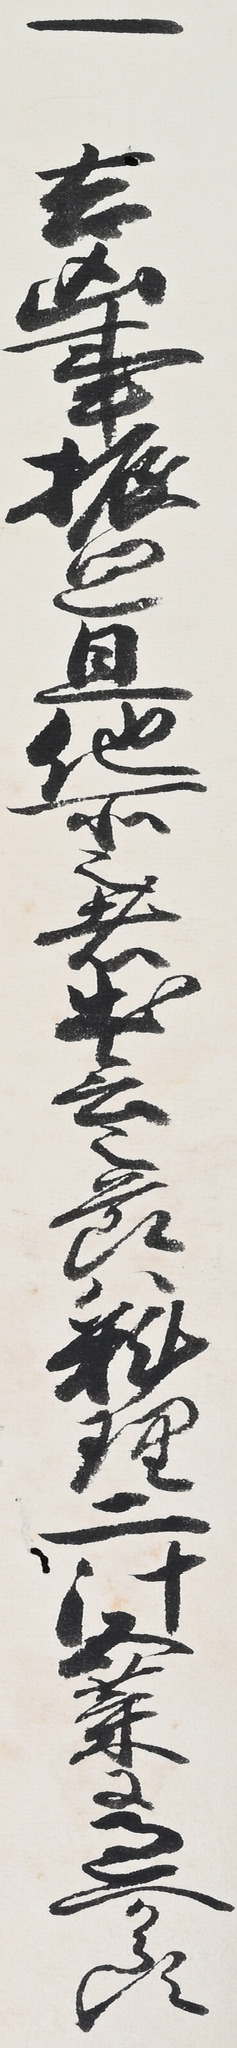一吉凶事振廻且他所之者出会之節ハ料理二汁五菜に過へからす
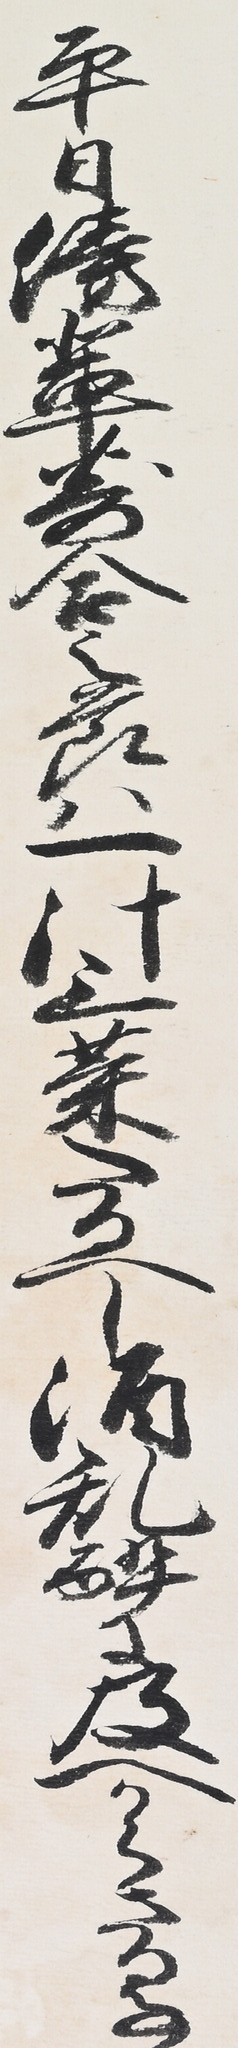平日傍輩寄合之節ハ一汁三菜たるへし酒乱酔に及へからさる事
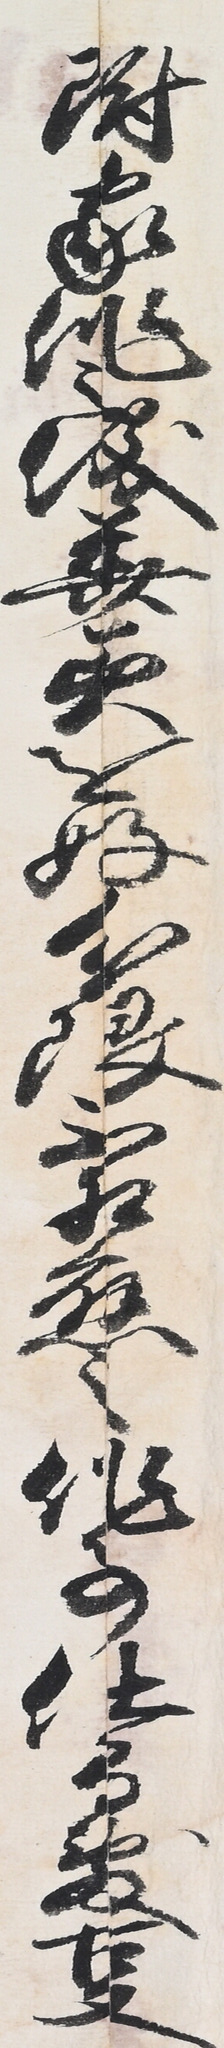附家作之儀華美を好分限不相応之作事仕間敷事
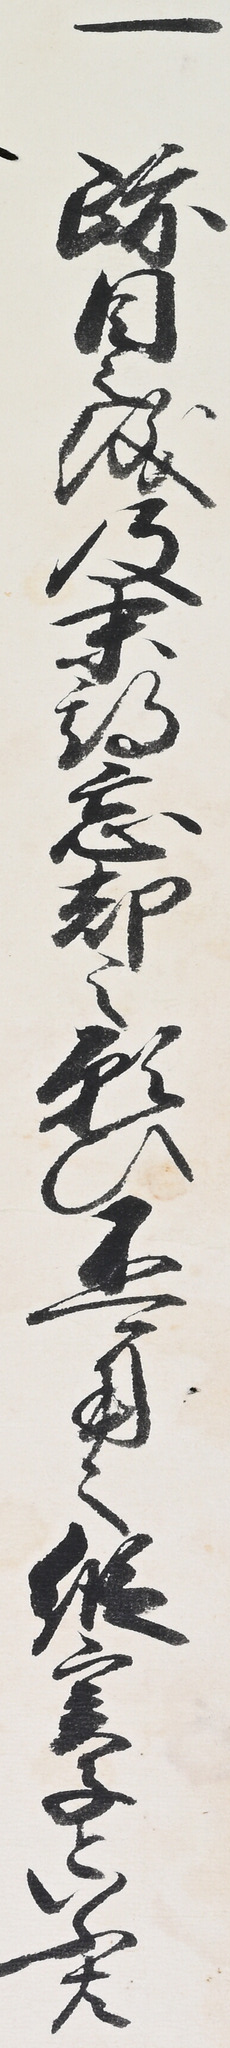一跡目之儀及末期忘却之願ひ不可用之縦実子といふ共
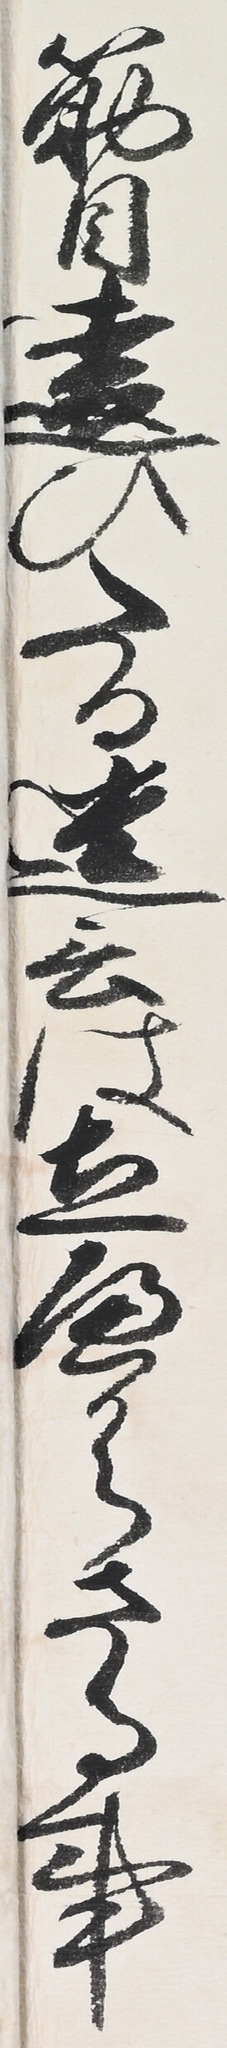筋目違ひたる遺言ハ立へからさる事

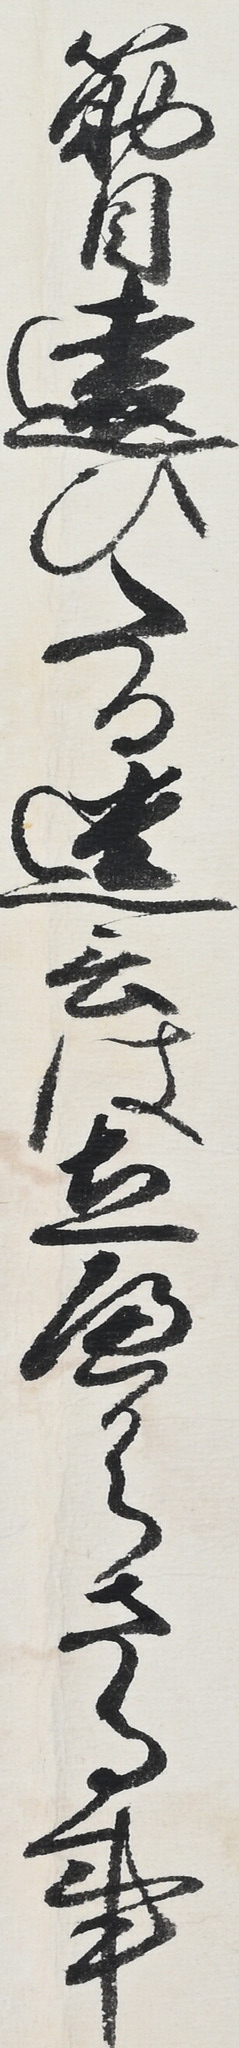筋目違ひたる遺言ハ立へからさる事
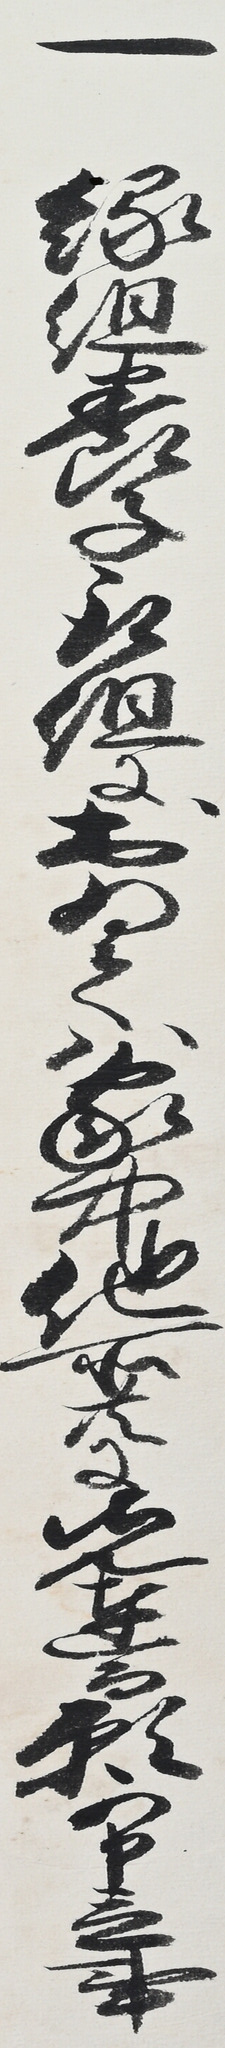一縁組養子取組におゐてハ家中他所共に先達而願可申立事
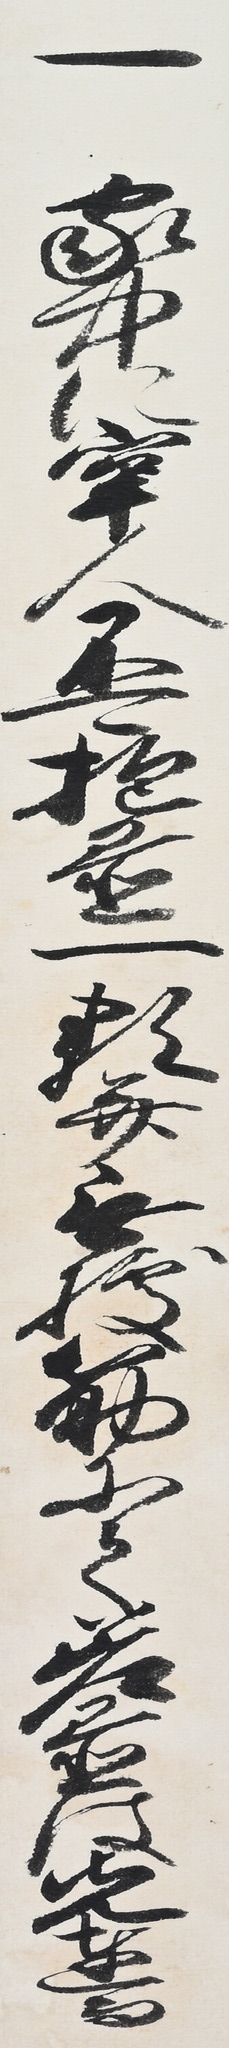一家中に牢人不可抱置一類幷無拠筋にて差置は先達而
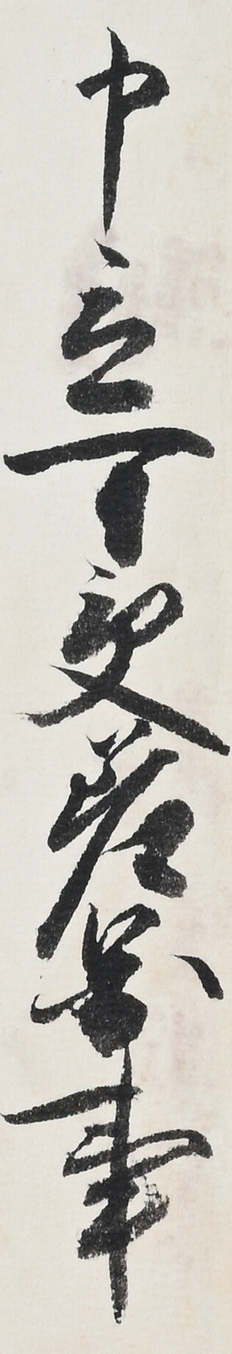申立可受差図事
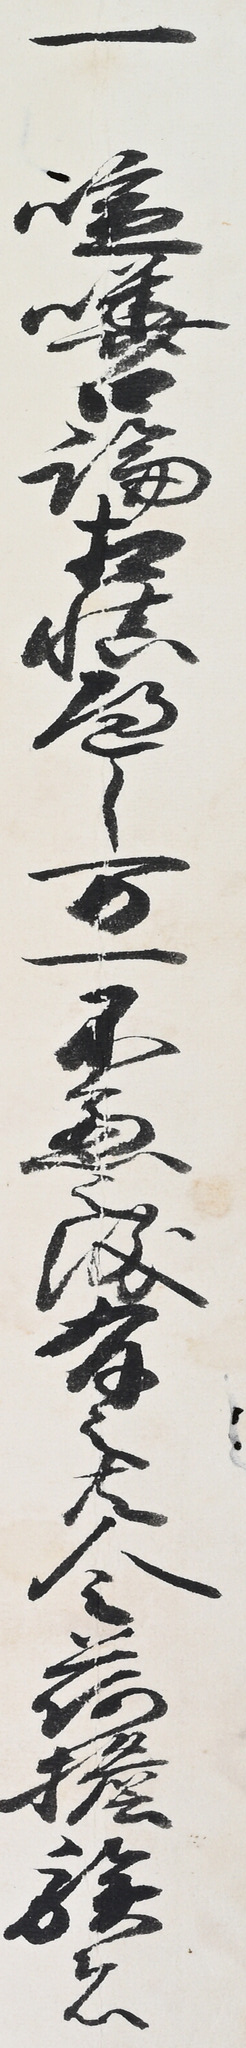一喧嘩口論相慎へし万一不慮之儀有之共令荷担族者
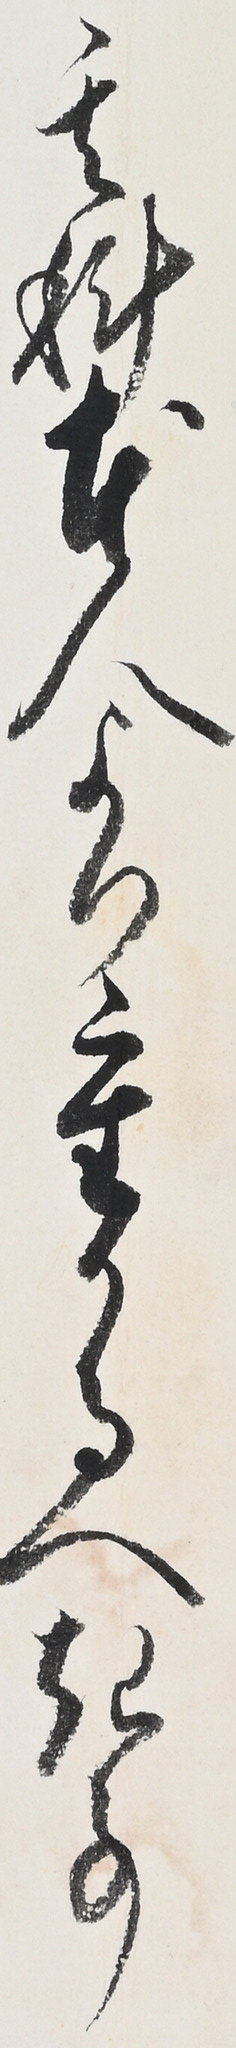其科本人より重かるへき事
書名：御条目〔同文二通一括〕
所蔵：伊那市立高遠町図書館・合同会社AMANE
